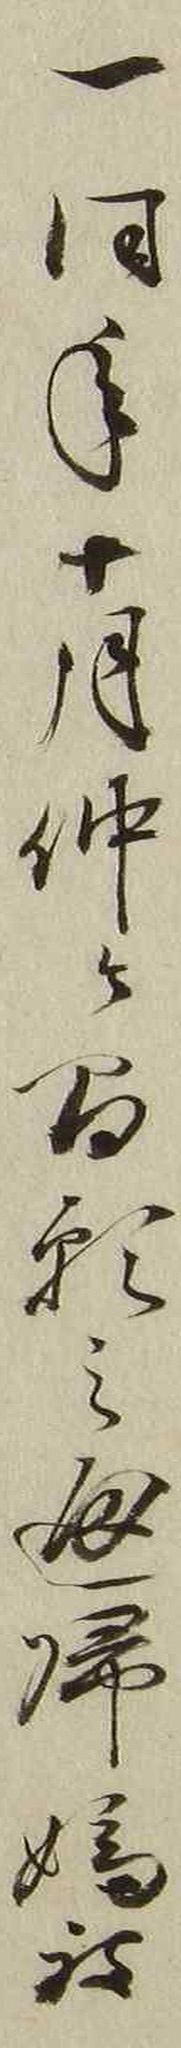一同年十月仲ヶ間願之通帰嫡被
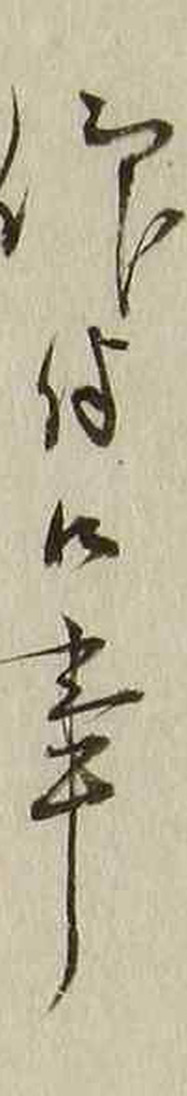仰付候事
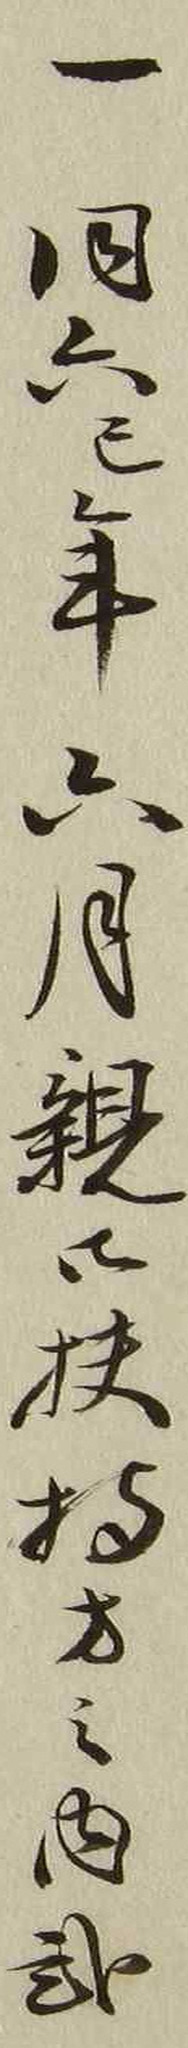一同六巳年六月親御扶持方之内弐
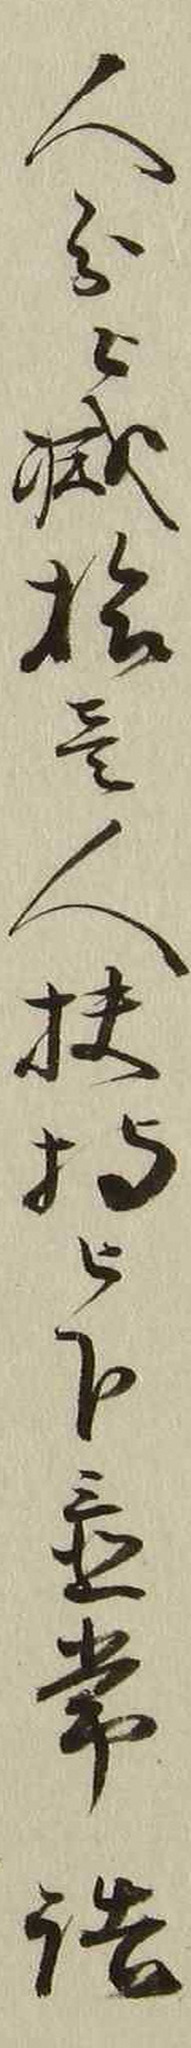人分被減拾壱人扶持被下置常詰
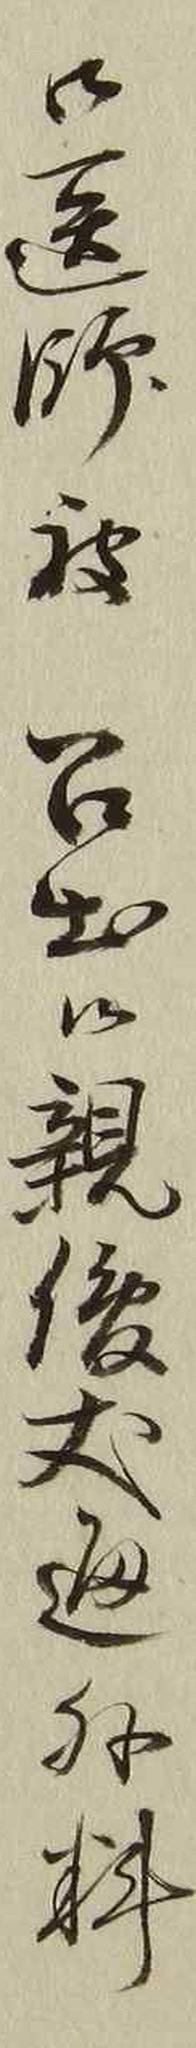御医師被召出候親俊丈通外料
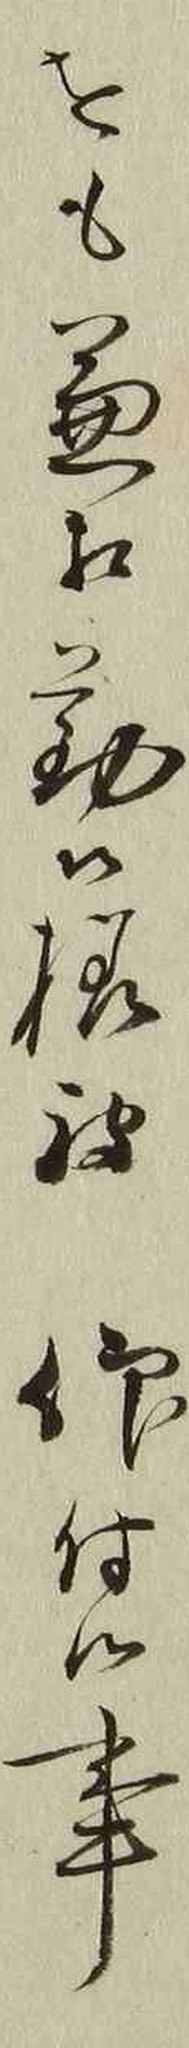をも兼相勤候様被仰付候事
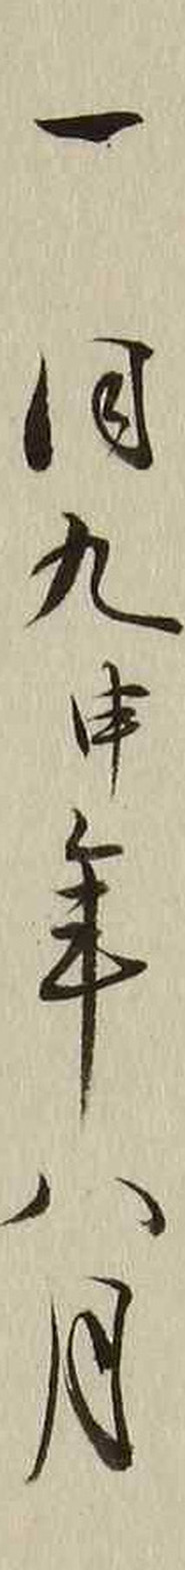一同九申年八月
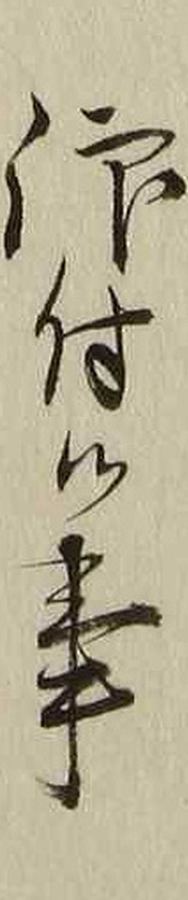仰付候事
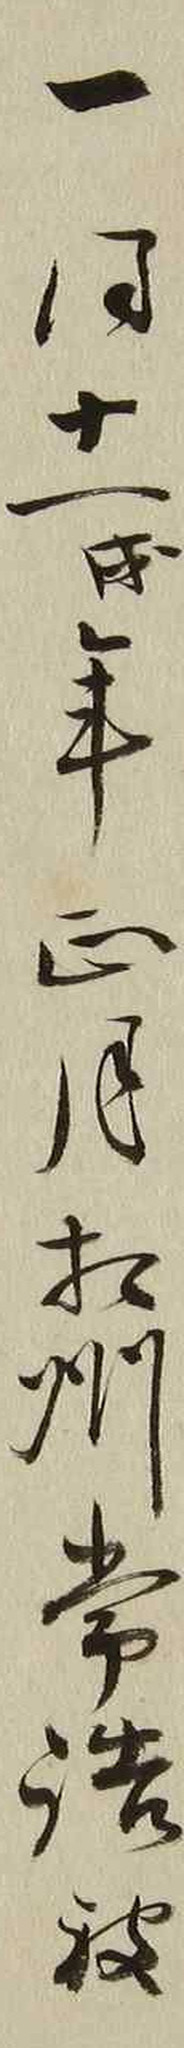一同十一戌年正月相州常詰被
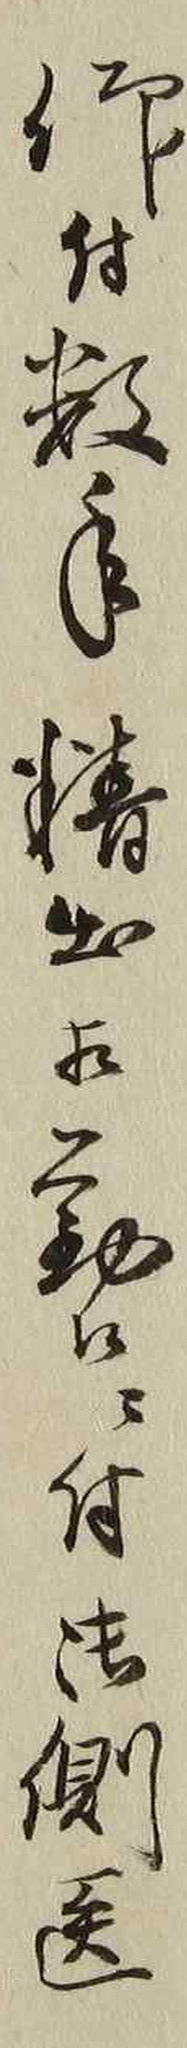仰付数年精出相勤候に付御側医
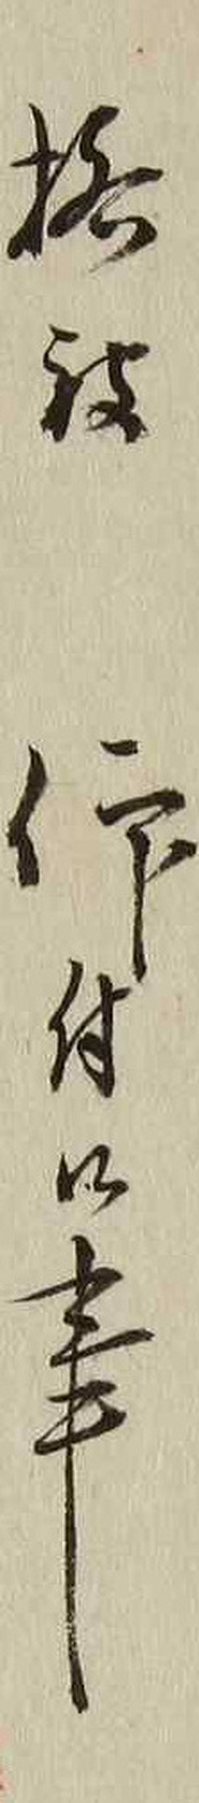格被仰付候事
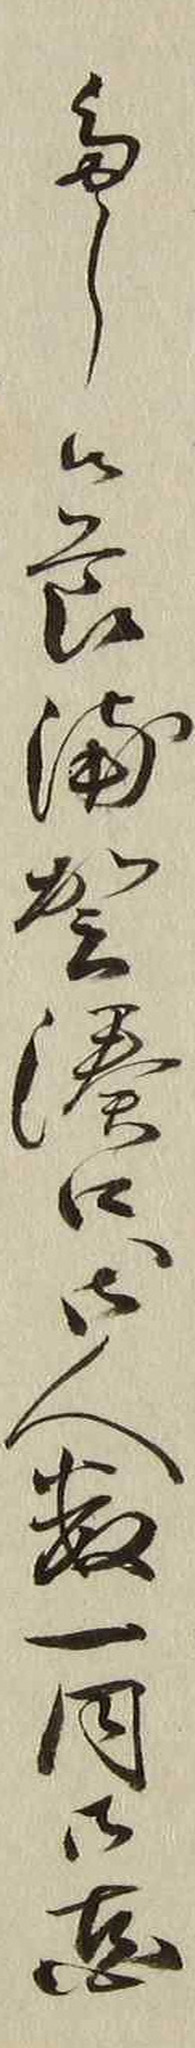たし候節浦賀湊口へ御人数一同御固
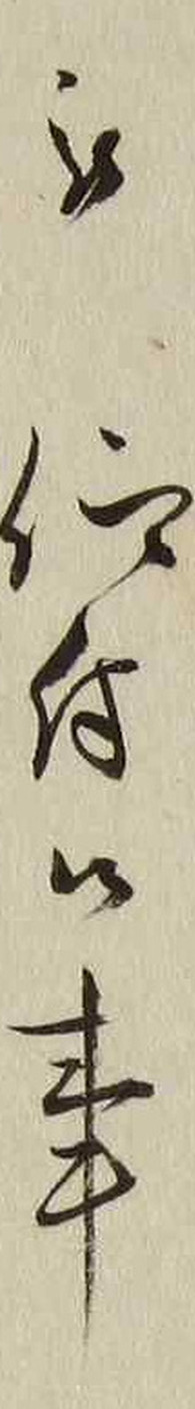被仰付候事
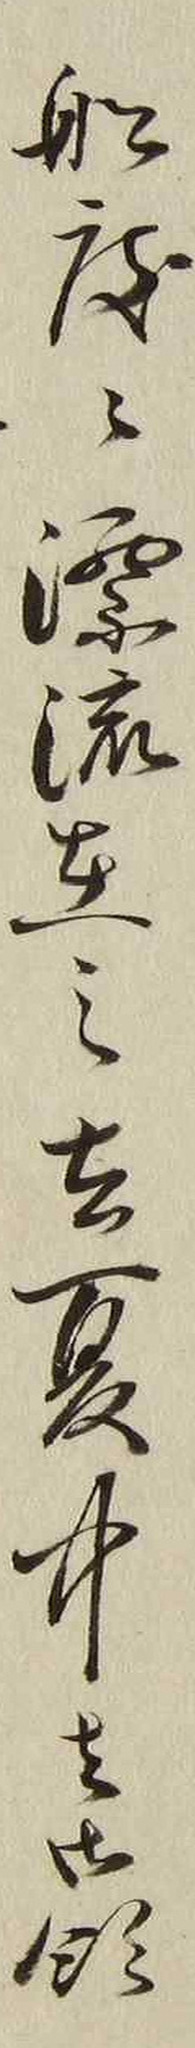船度々漂流在之去夏中は御領
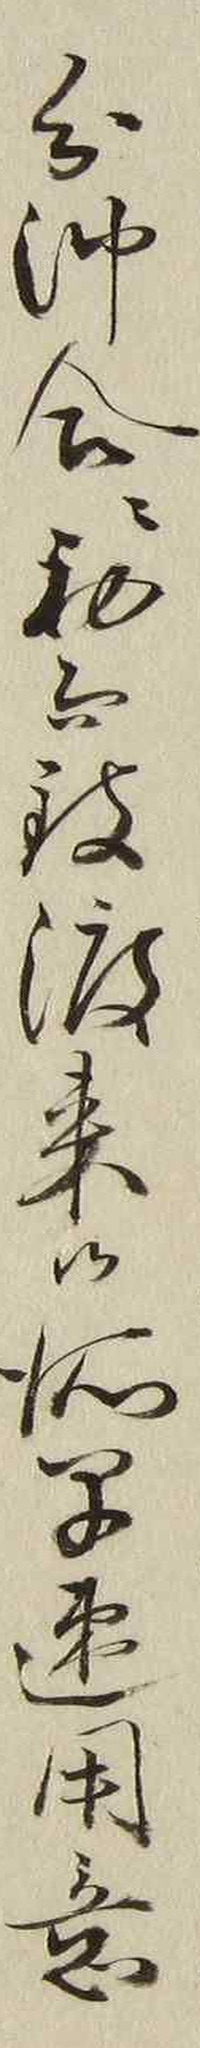分沖合に初而致渡来候所早速用意
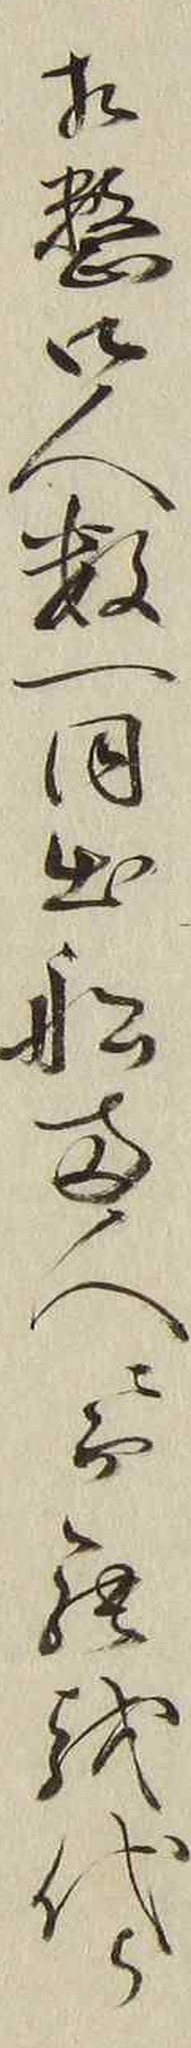相整御人数一同出船両人に而罷越代り
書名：諸士系譜　巻之157　ね之部1
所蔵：会津若松市立会津図書館
